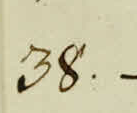38.
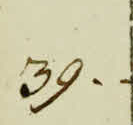39.
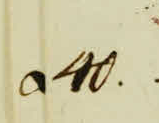40.
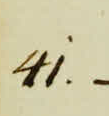41.
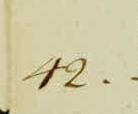42.
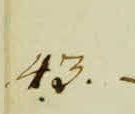43.
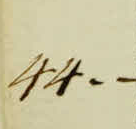44.
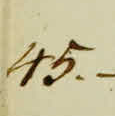45.
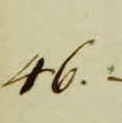46.
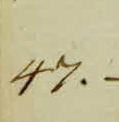47.
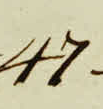47
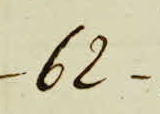62
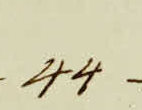44
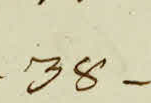38
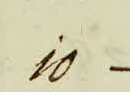10
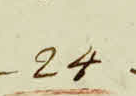24
